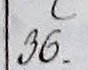36
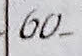60
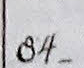84
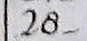28
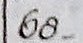68
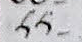55
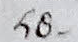58
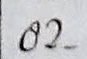82
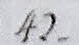42
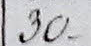30
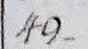49
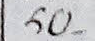50
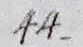44
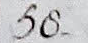58
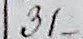31
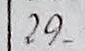29
